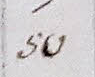50
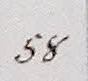58
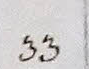33
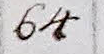64
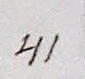41
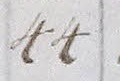44
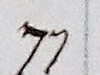77
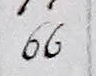66
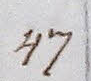47
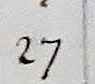27
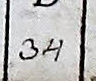34
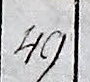49
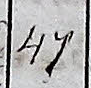47
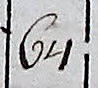64
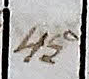45
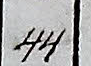44
